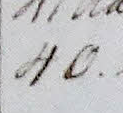40
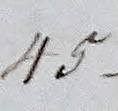45
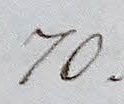70
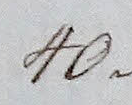40
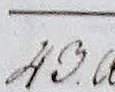43
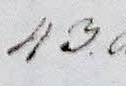43
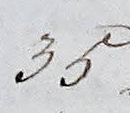35
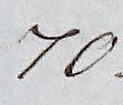70
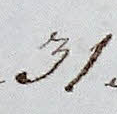31
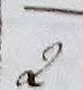2
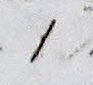1
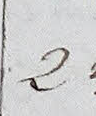2
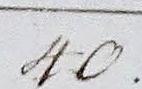40
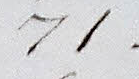71
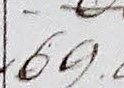69
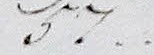347
